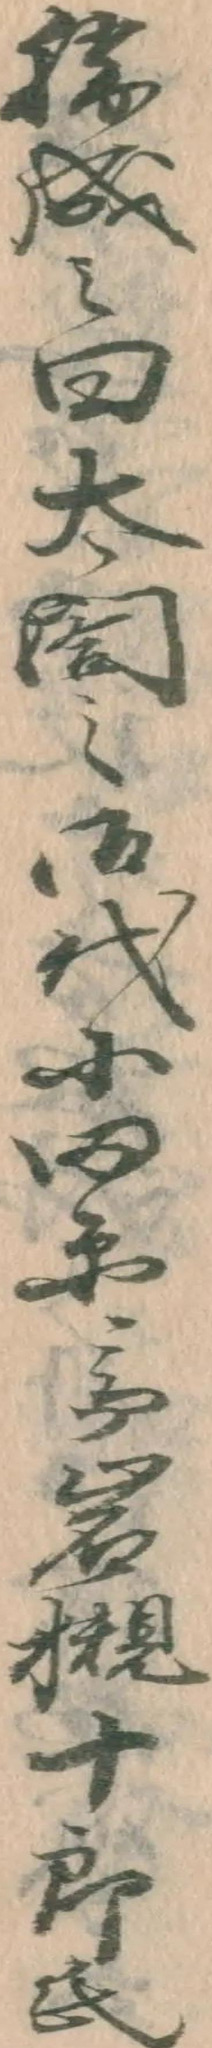勝成之曰太閤之御代小田原に而岩槻十郎氏
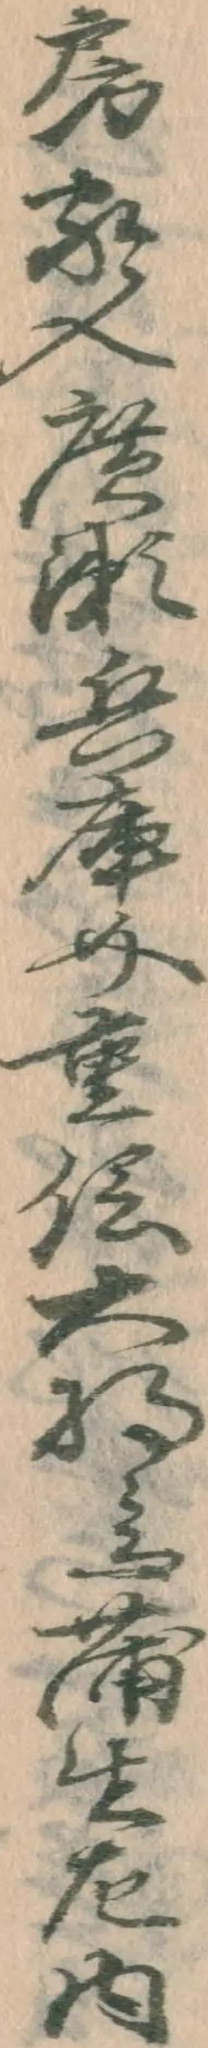房家人広瀬兵庫介重信大将に而蒲生左内
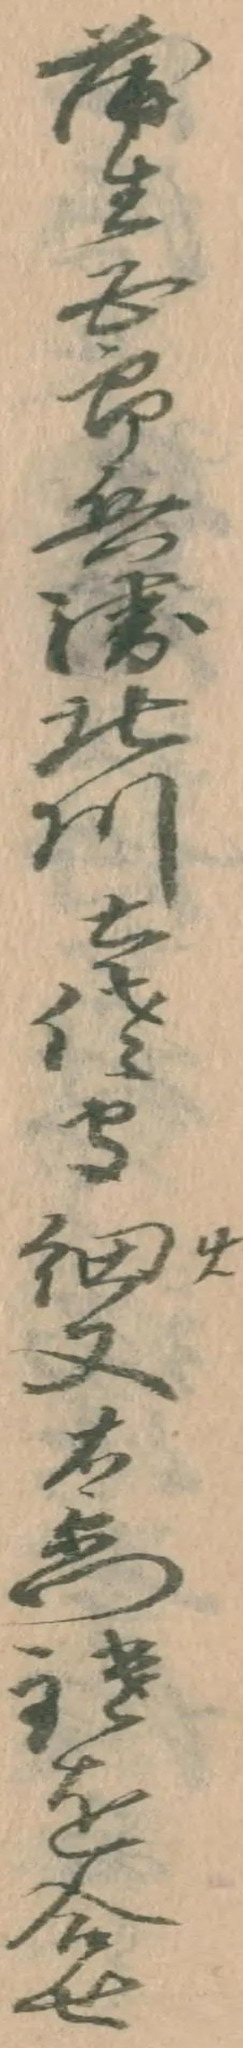蒲生五郎兵衛北川土佐守細又右衛門鑓を合せ
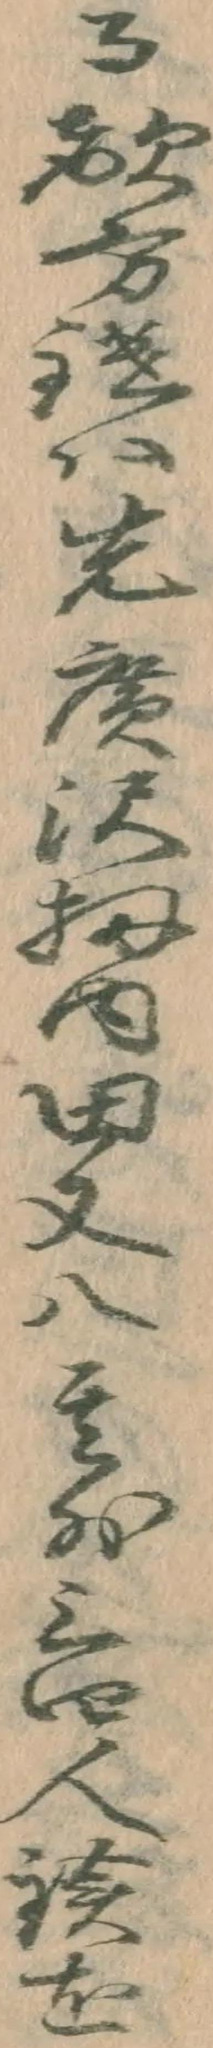る敵方鑓は先広沢扨内田又八其外三四人鎗を
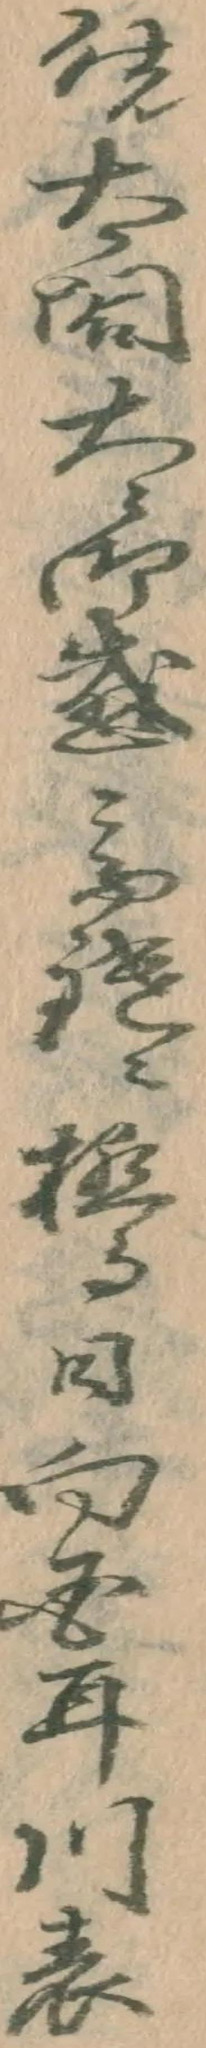仕る太閤大に御盛に而鑓に極る日向国耳川表
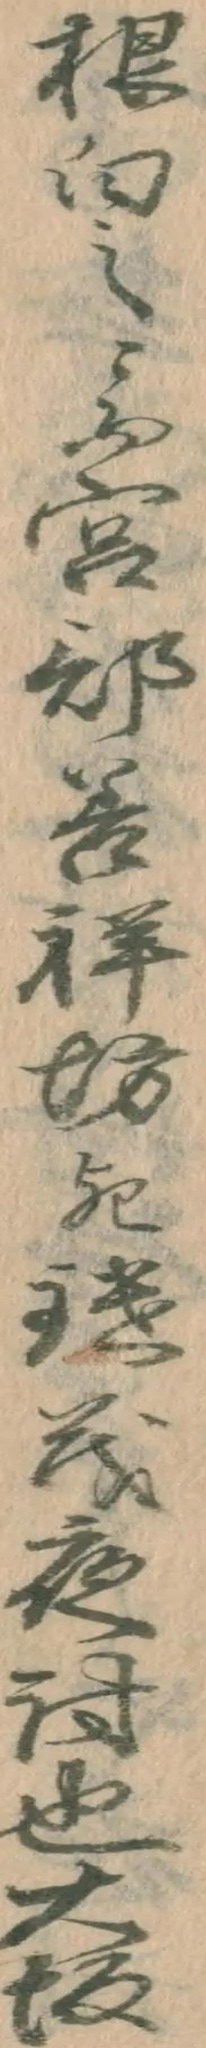根白之に而宮部善祥坊歟鑓茂夜討也大坂
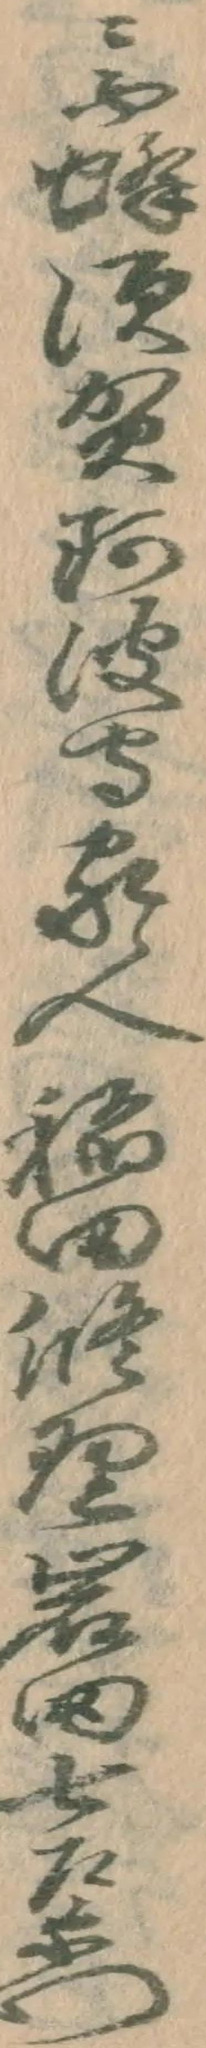に而蜂須賀阿波守家人福田修理岩田七左衛門
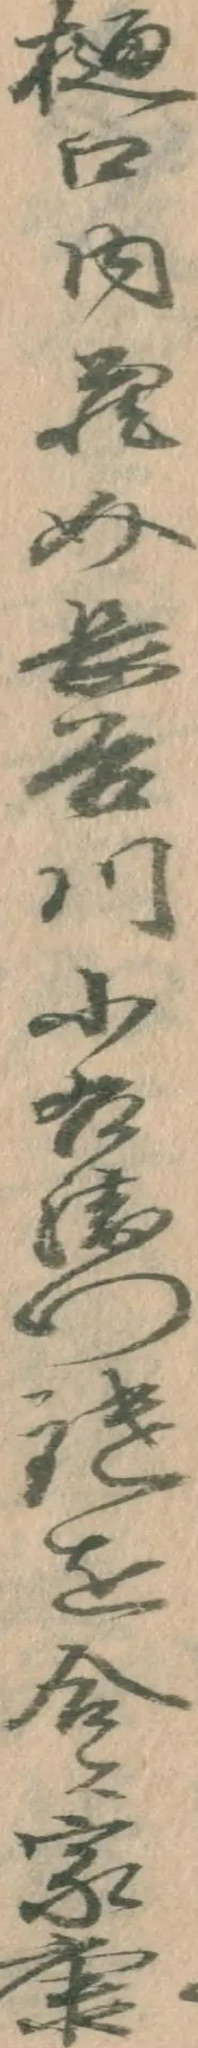樋口内蔵介長谷川小右衛門鑓を合す家康
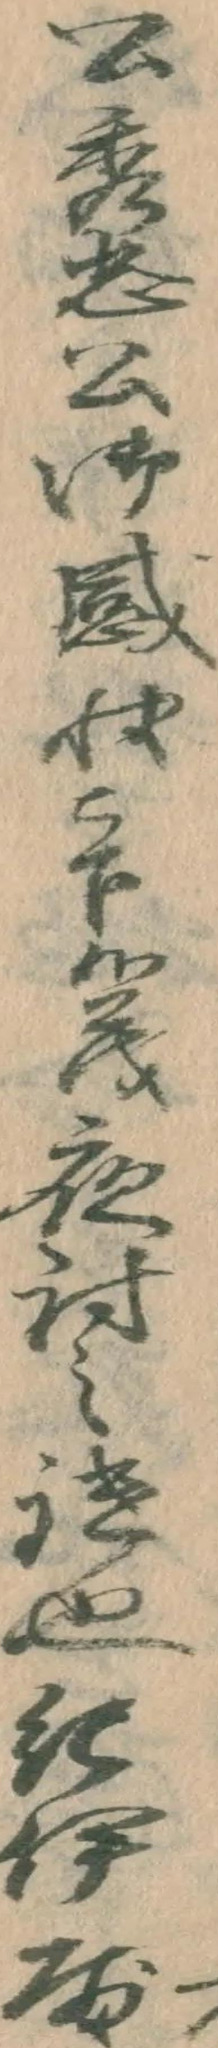公秀忠公御感城状被下候茂夜討之鑓也紀伊殿
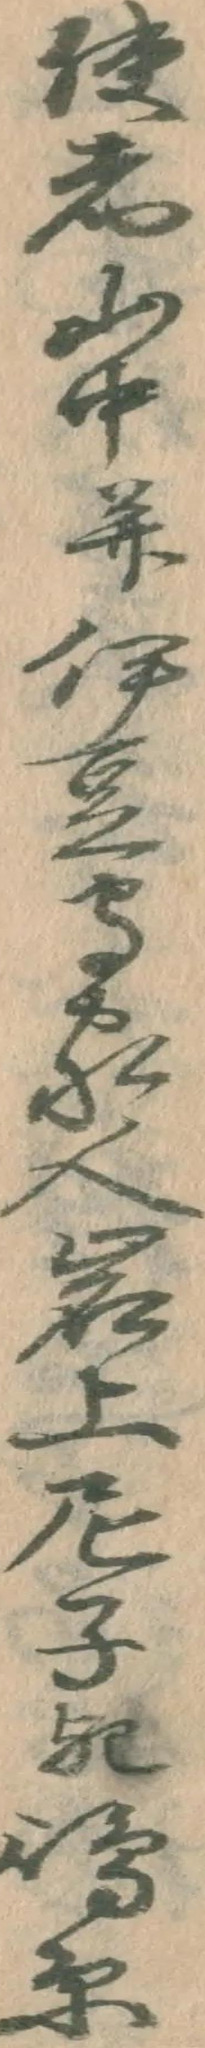使者山中幷伊豆守家人岩上尼子歟島原
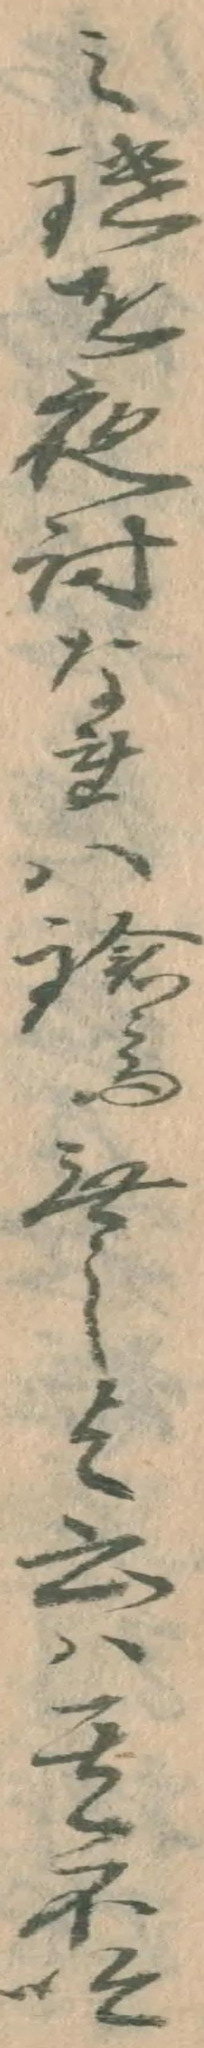之鑓を夜討な連は鎗に而無之与云は其不吟

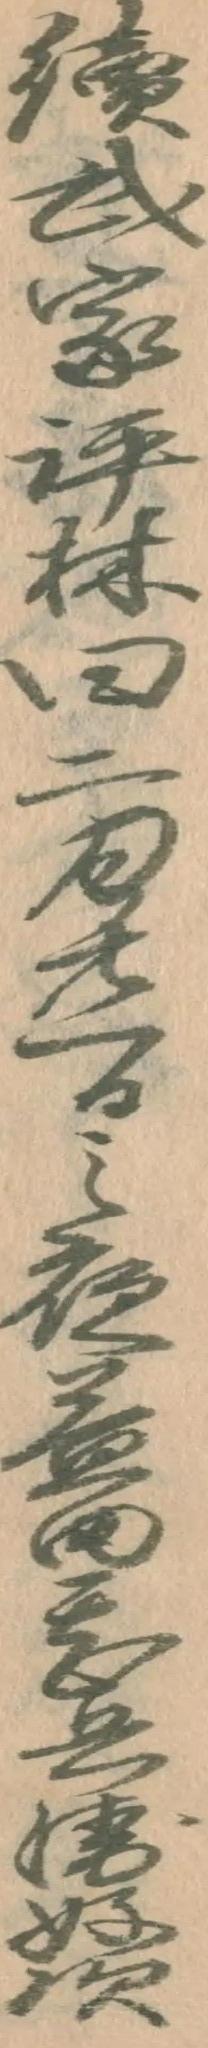続武家評林曰二月廿一日之夜益田甚兵衛好次
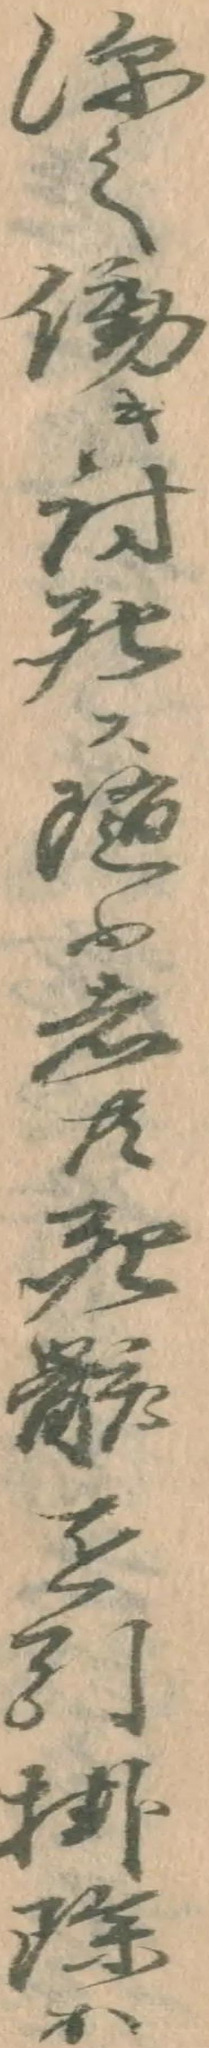深く働き討死す随ふ者共死骸を引掛除か
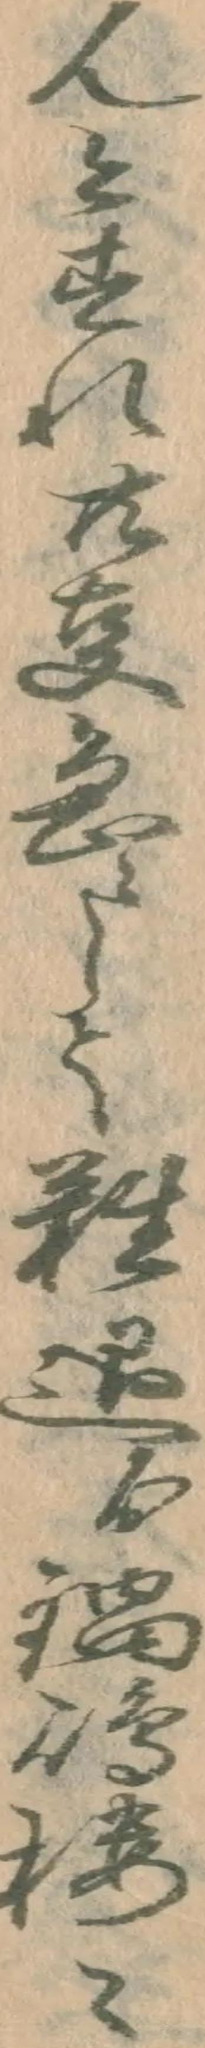んと春れ共事急にして難追ゟ鍋島樓に
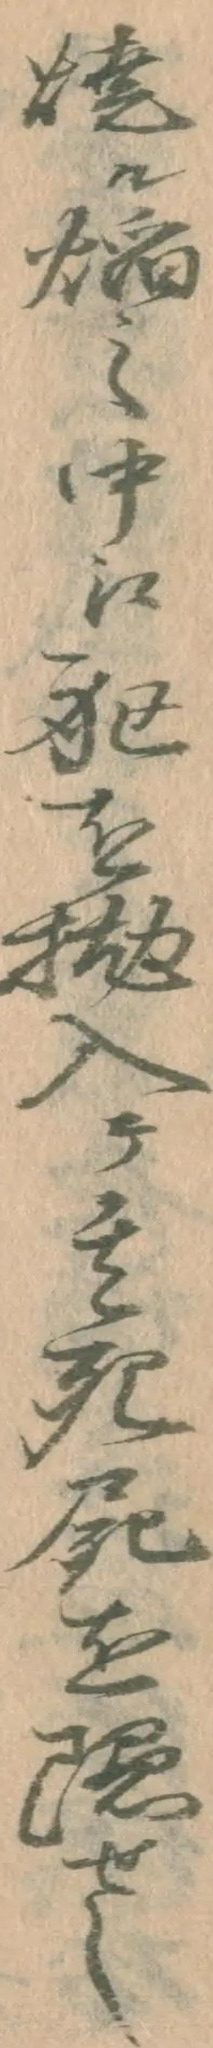焼る焔之中江躯を抛入て其死屍を隠せし
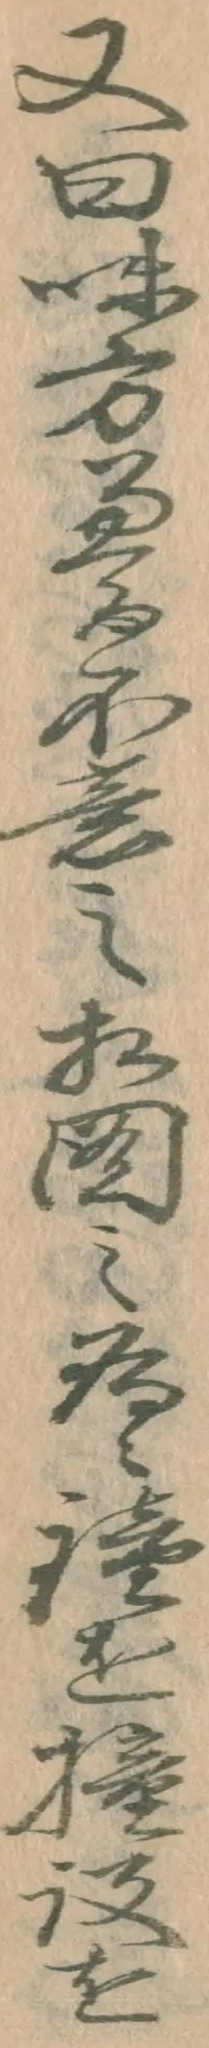又曰味方兼而不意之相図之為に鐘を撞設を
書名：切支丹御退治記 49巻. [7]
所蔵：国立国会図書館 National Diet Library, JAPAN
